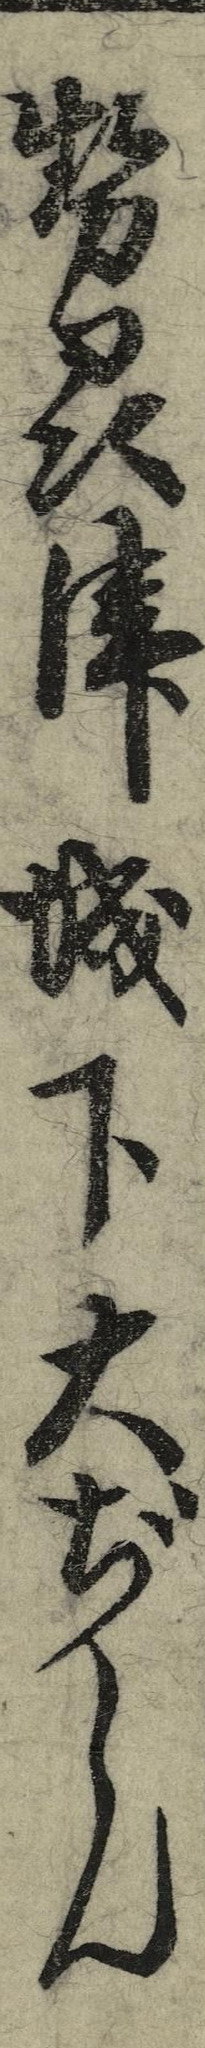勢州津城下大ぢしん
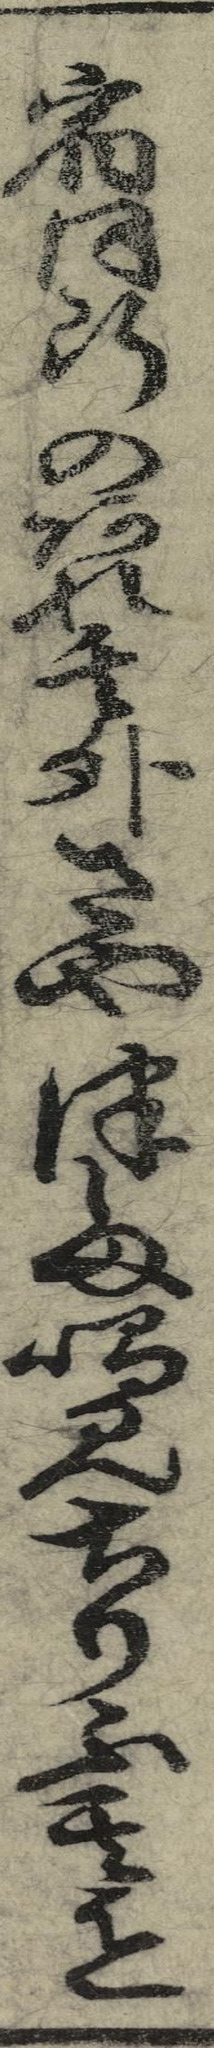宿同断のあれ其外さや津しま鳴見ちりふ其近
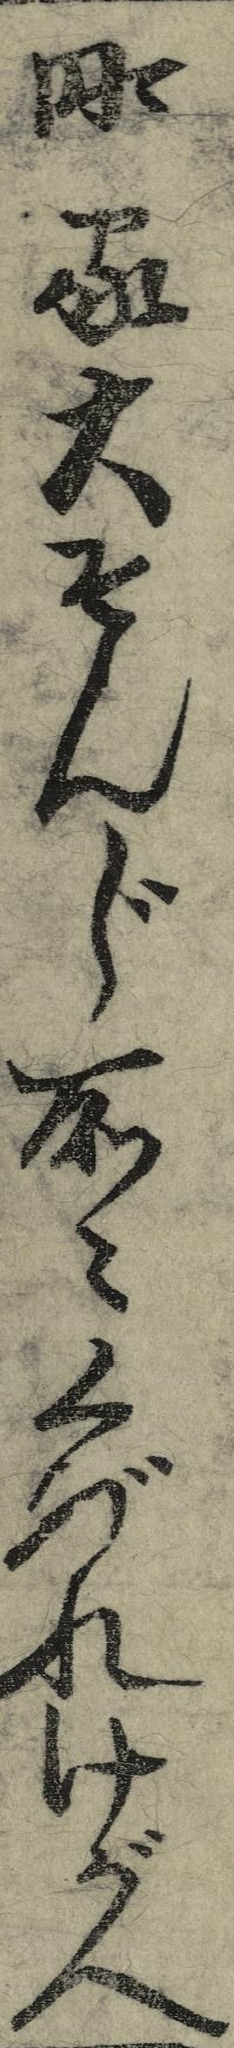町家大そんじ所々くづれけが人
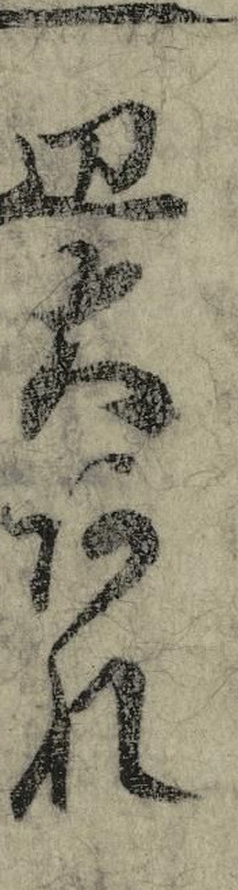辺大あれ
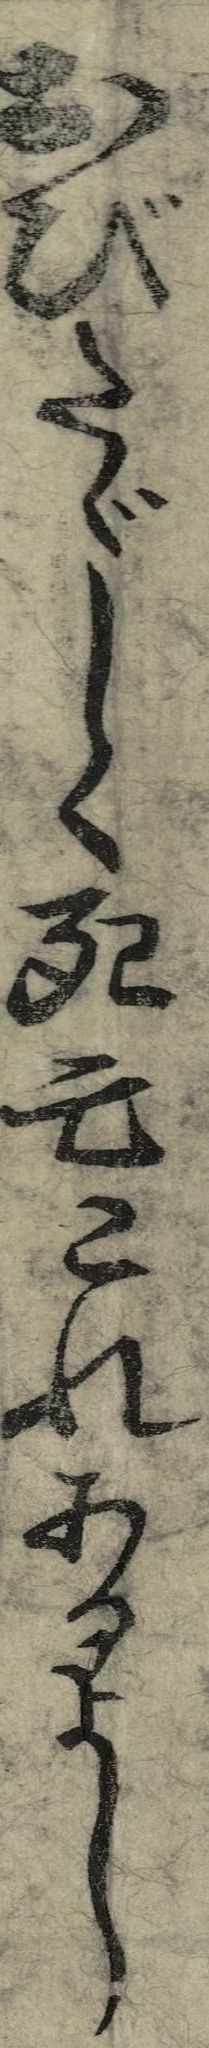おびたゞしく死亡これあるよし
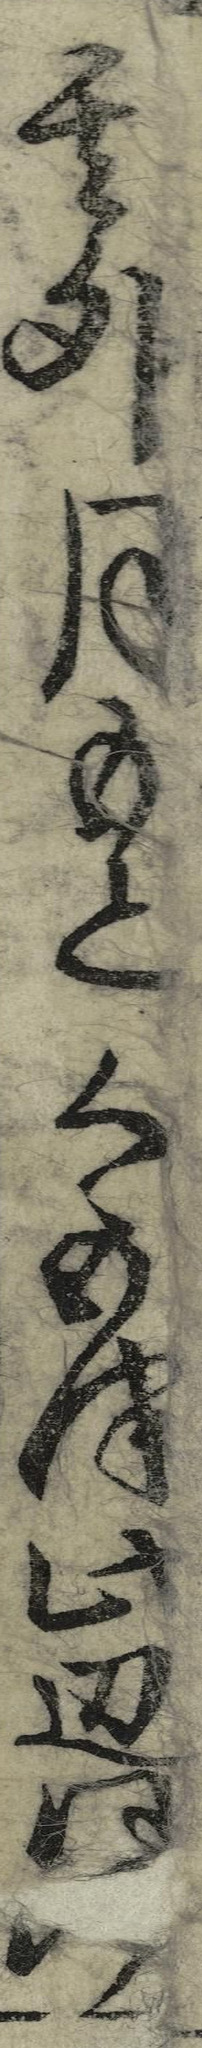其外月もとくも津此辺同断
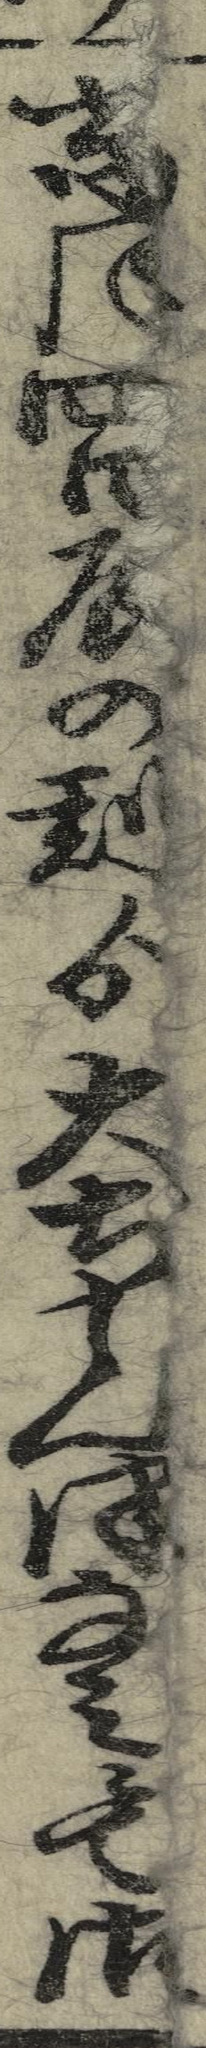当月四日辰の刻ゟ大ちしん津なミニて御
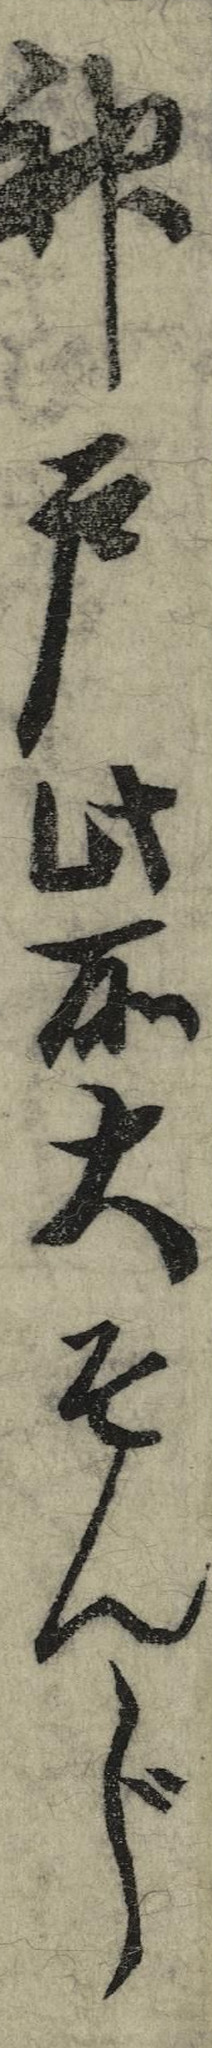神戸此所大そんじ
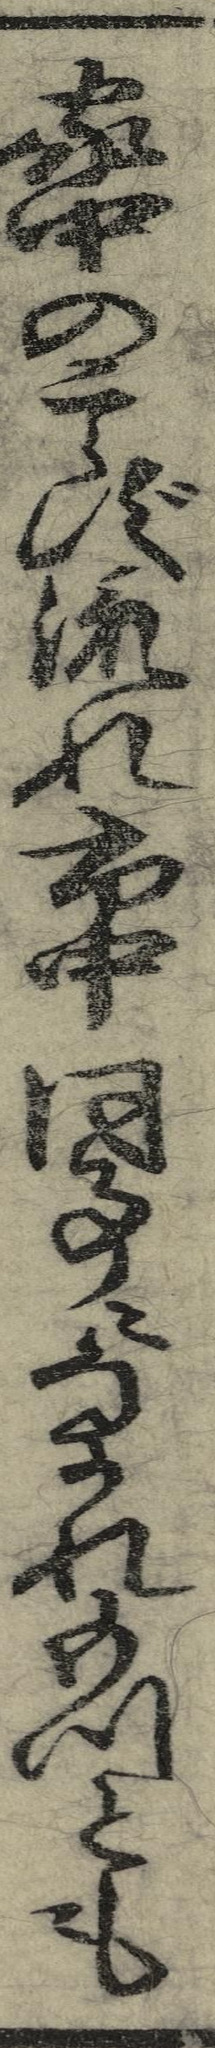家中のこらず流れ市中同事ニながれも川とも
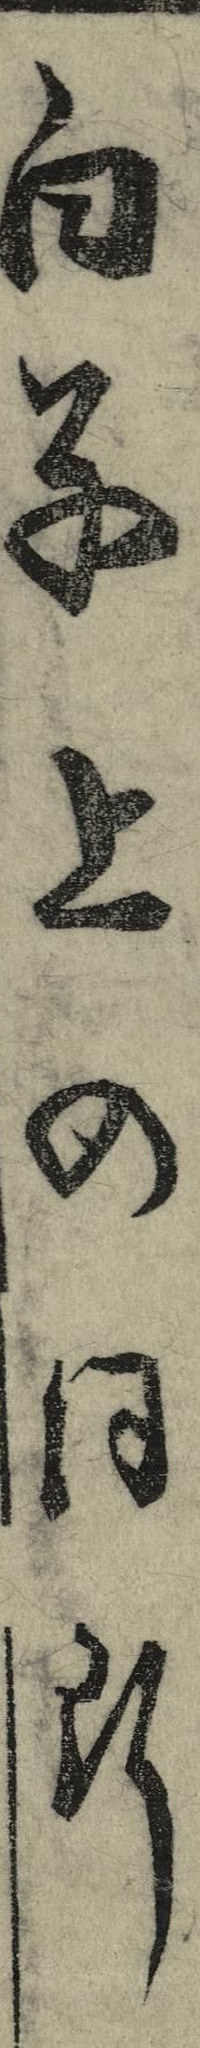白子上の同断
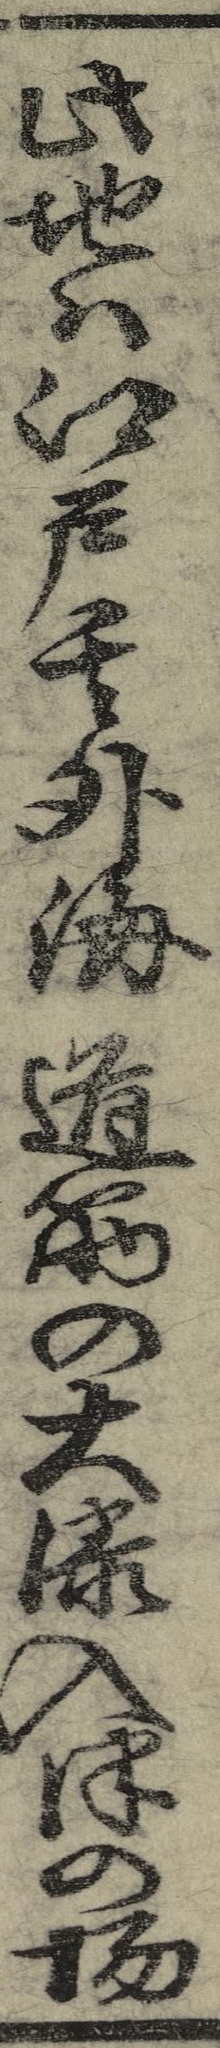此地ハ江戸其外海道筋の大湊入津の場
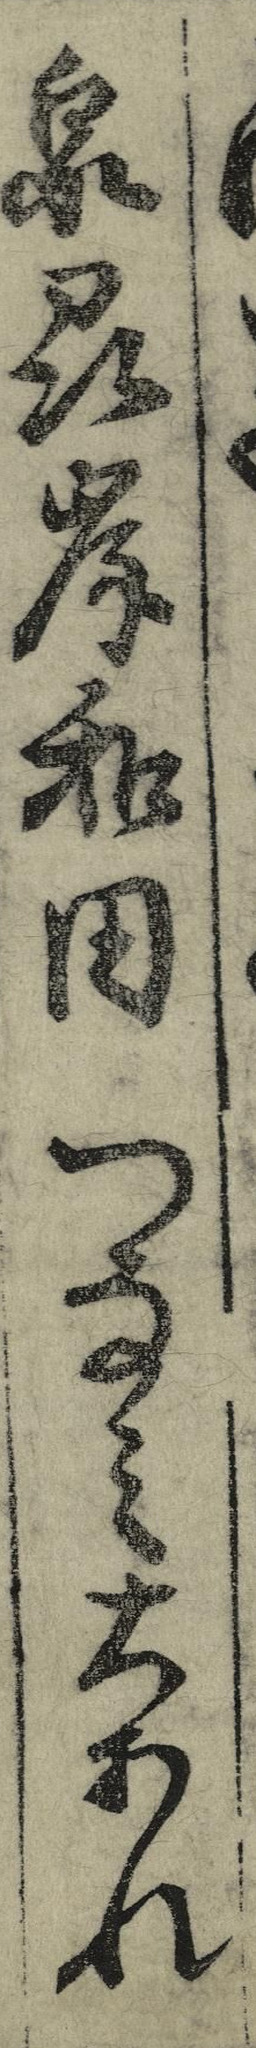泉州岸和田つなミ大あれ
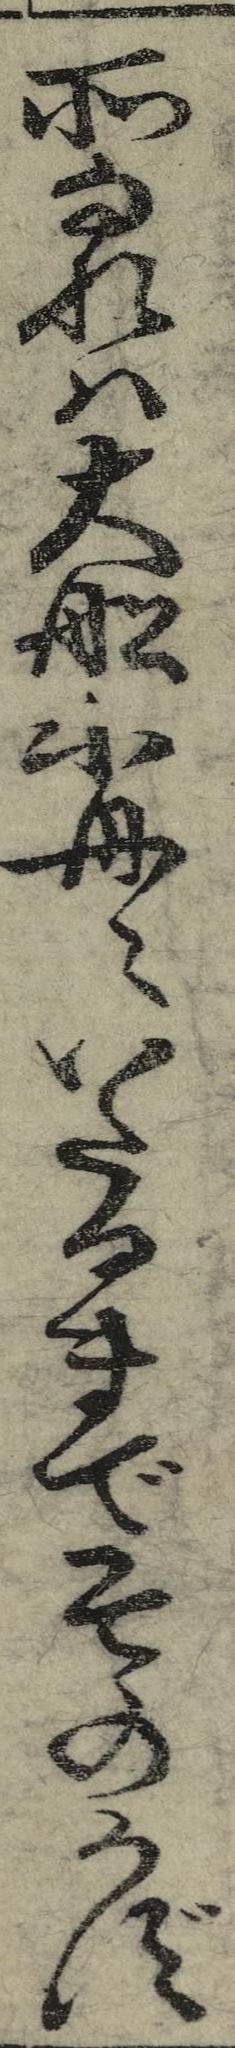所なれハ大船小舟ニいたるまでそのかず
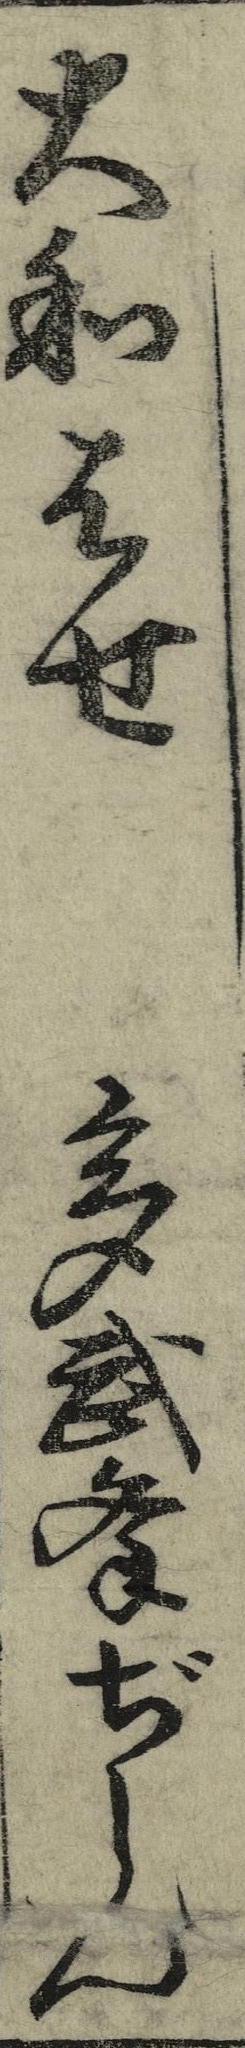大和はせ多武峰ぢしん
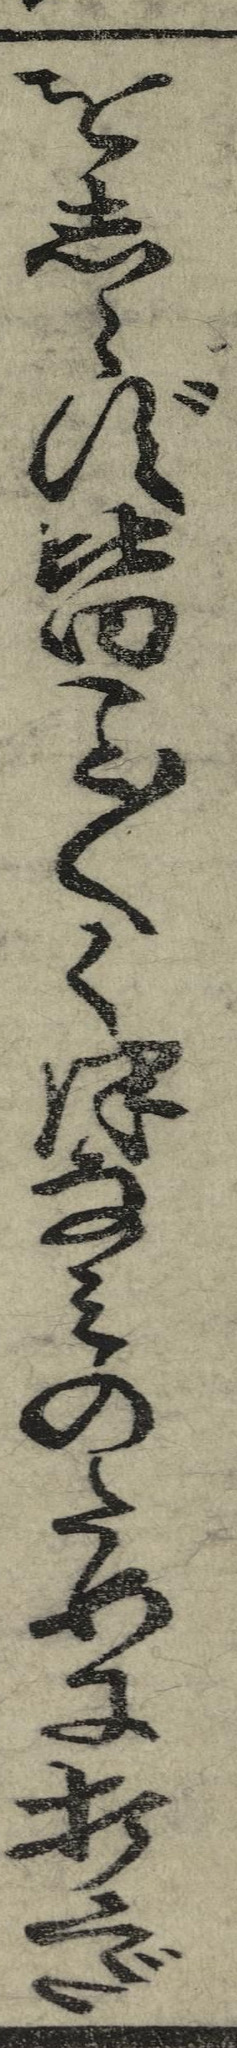を知らず皆こと〴〵く津なミのために打くだ
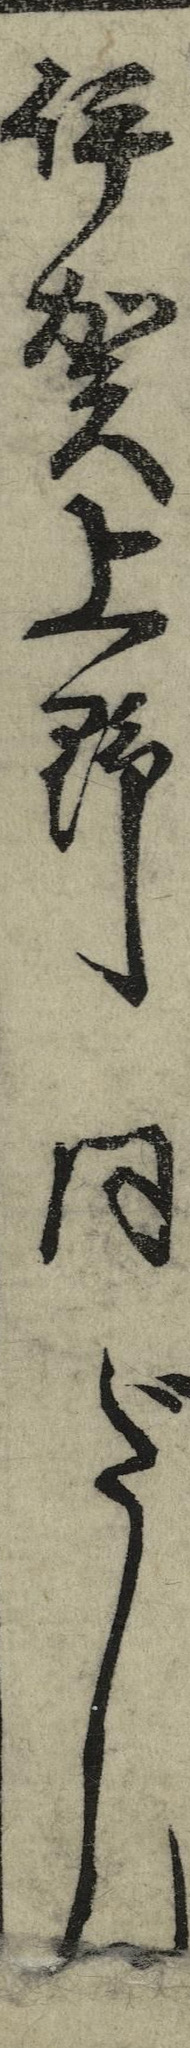伊賀上野同だん
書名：諸國大地震つなみ混乱記　嘉永七寅十一月四日五日両日之次第三編
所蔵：東京大学地震研究所図書室 Earthquake Research Institute Library, The University of Tokyo, JAPAN
